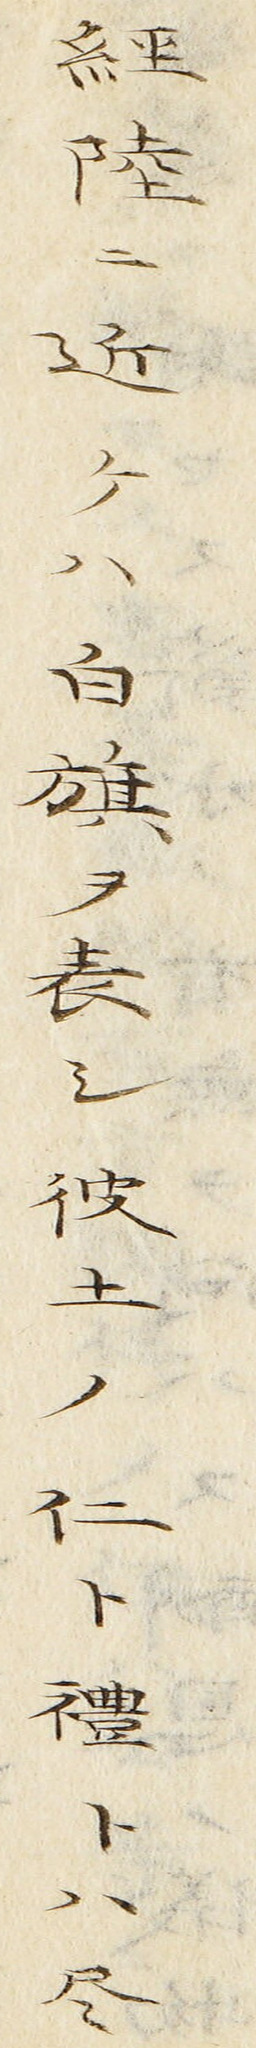経陸ニ近ケハ白旗ヲ表シ彼土ノ仁ト禮トハ尽
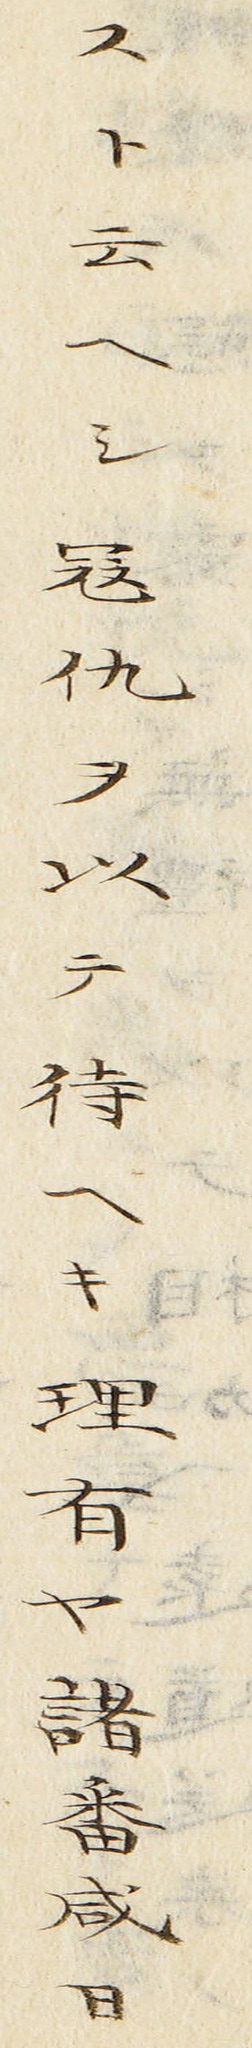スト云ヘシ寇仇ヲ以テ待ヘキ理有ヤ諸番咸日
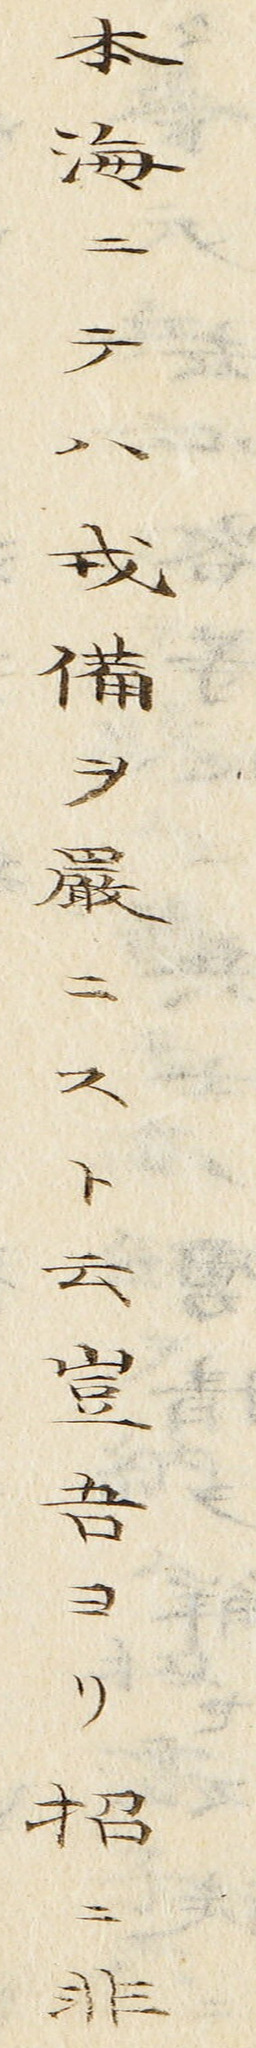本海ニテハ戎備ヲ嚴ニスト云豈吾ヨリ招ニ非
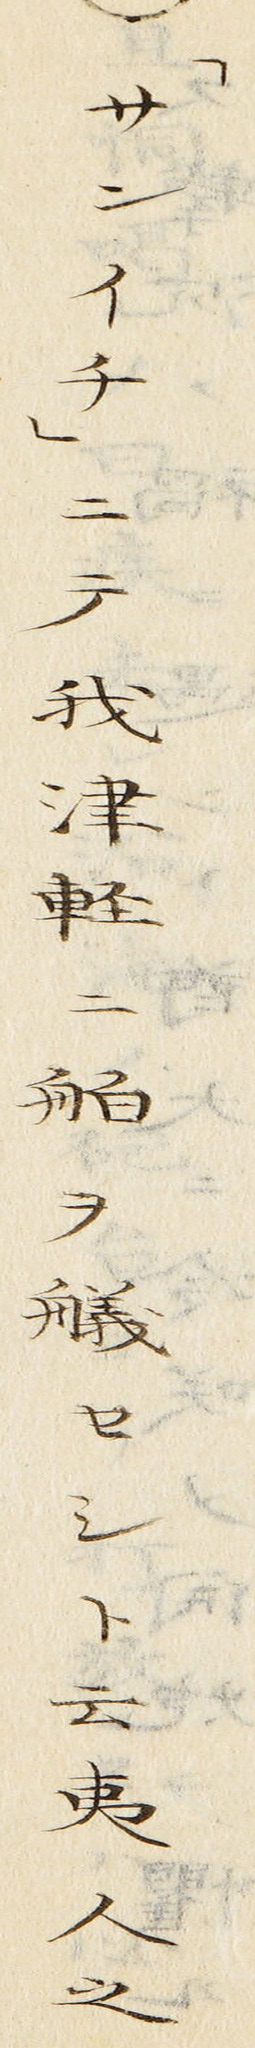〇「サンイチ」ニテ我津軽ニ舶ヲ艤セシト云夷人之
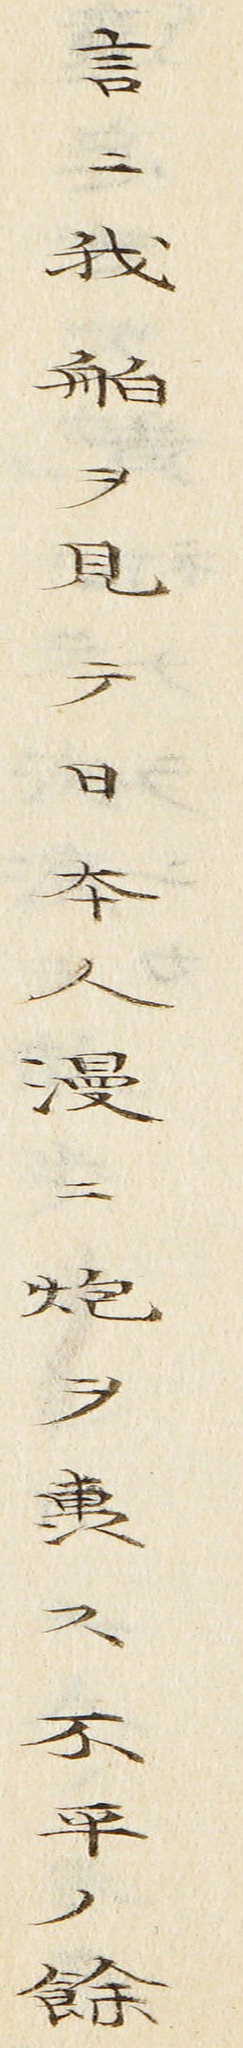言ニ我舶ヲ見テ日本人漫ニ炮ヲ軣ス不平ノ餘
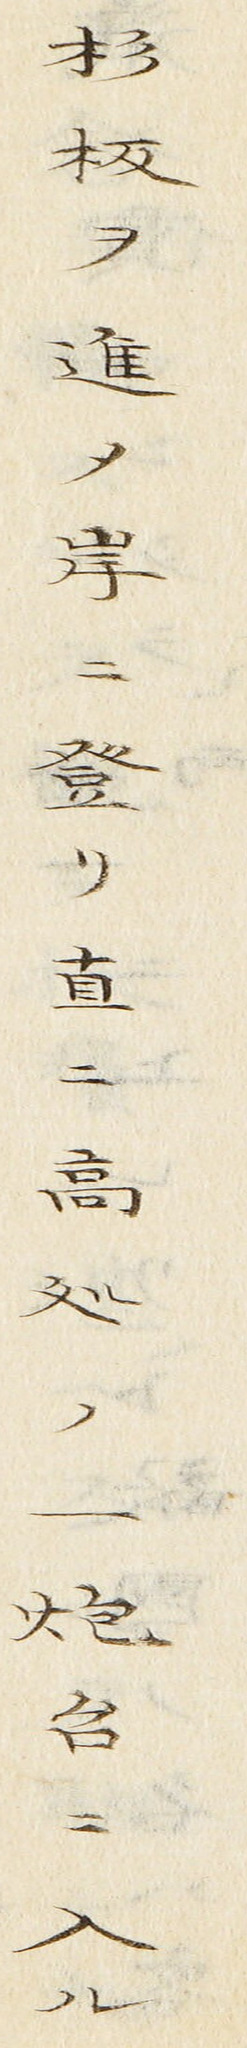杉板ヲ進メ岸ニ登リ直ニ高処ノ一炮台ニ入ル
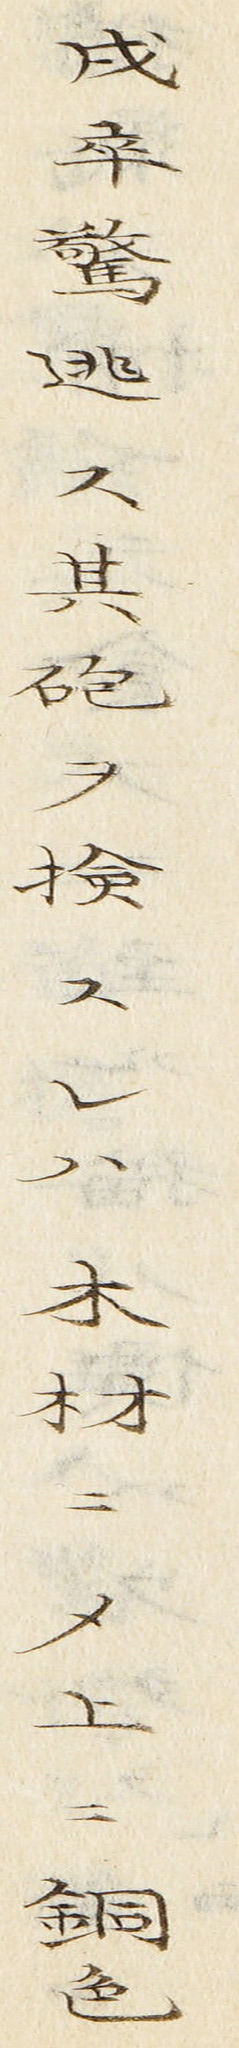戍卒驚逃ス其砲ヲ検スレハ木材ニシテ上ニ銅色
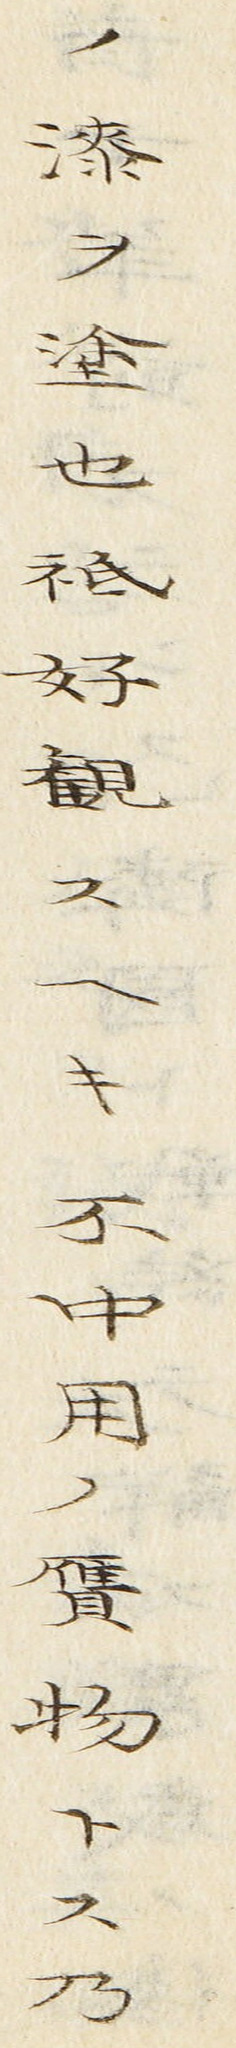ノ漆ヲ塗也祗好観スヘキ不中用ノ贋物トス乃
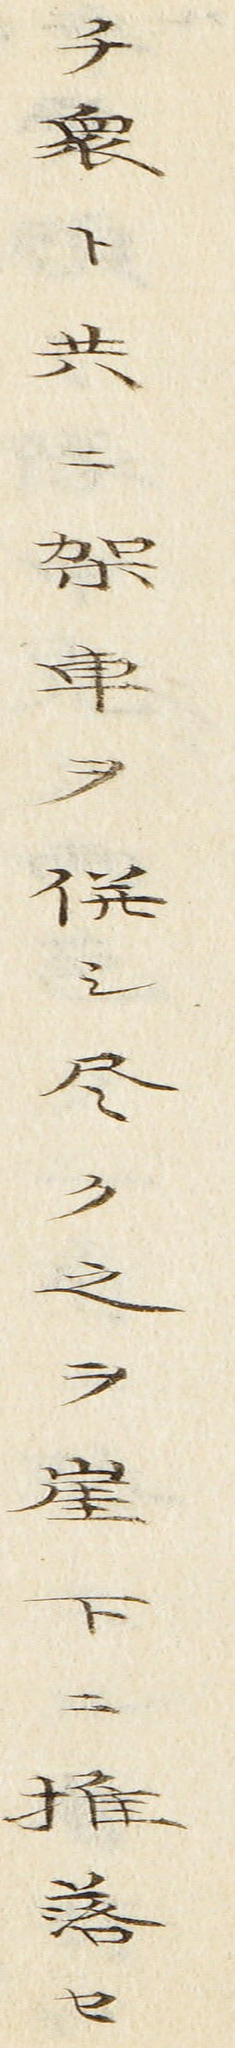チ衆ト共ニ架車ヲ併シ尽ク之ヲ崖下ニ推落セ
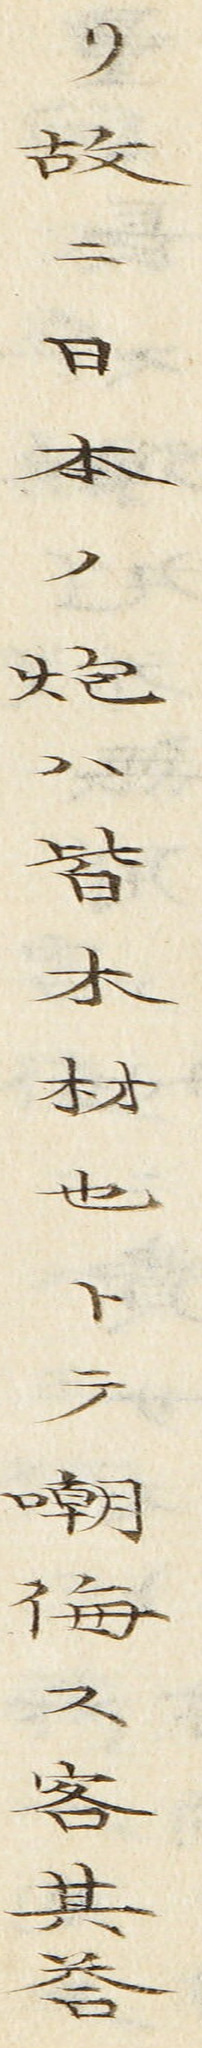リ故ニ日本ノ炮ハ皆木材也トテ嘲侮ス客其答
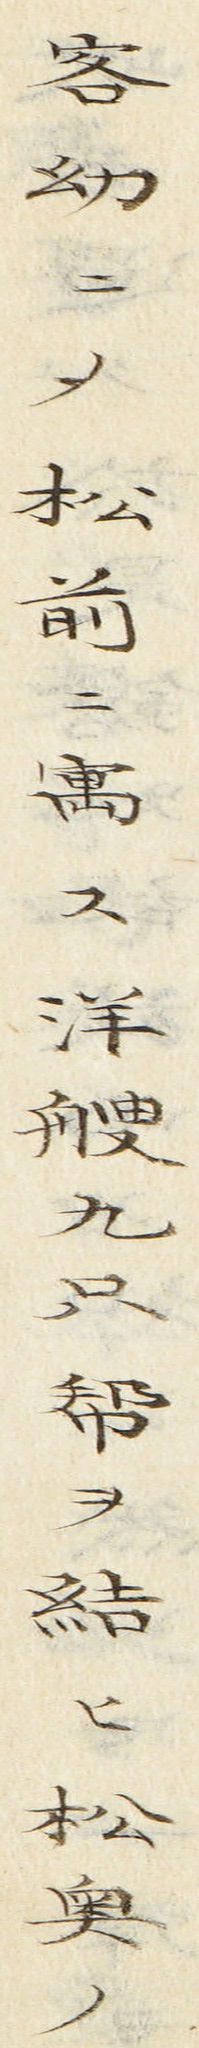〇客幼ニシテ松前ニ寓ス洋艘九只帮ヲ結ヒ松奥ノ

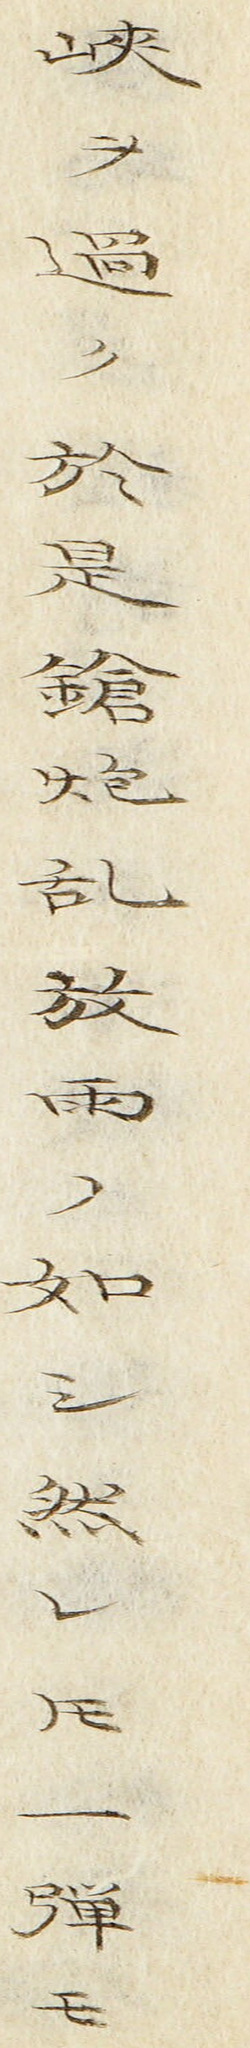峡ヲ過ク於是鎗炮乱放雨ノ如シ然レトモ一弾モ
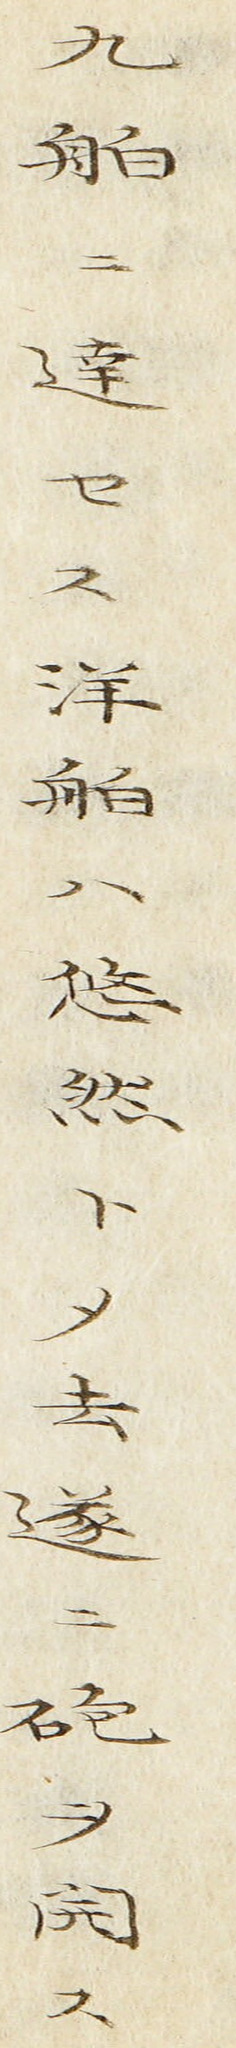九舶ニ達セス洋舶ハ悠然トシテ去遂ニ砲ヲ開ス
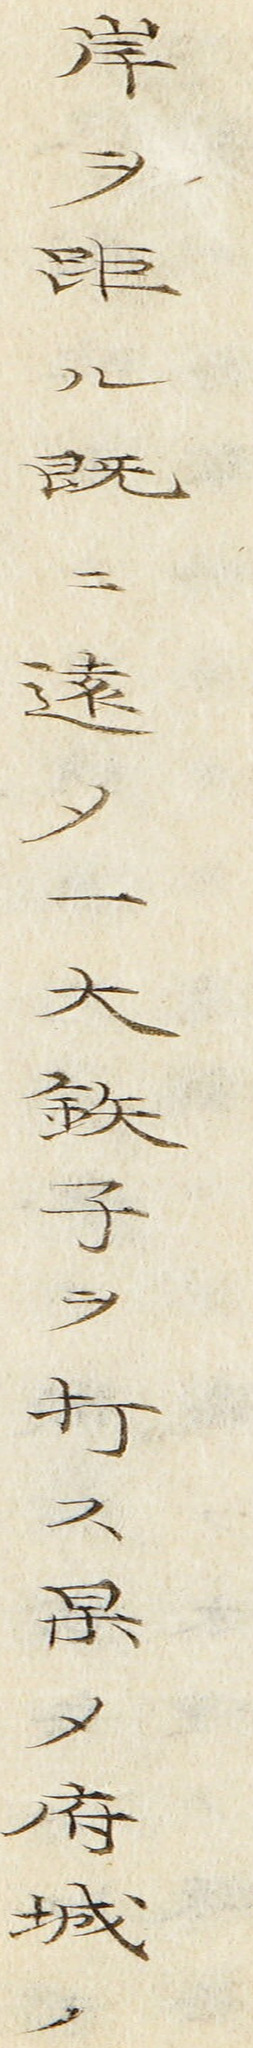岸ヲ距ル既ニ遠シテ一大鉄子ヲ打ス果シテ府城ノ
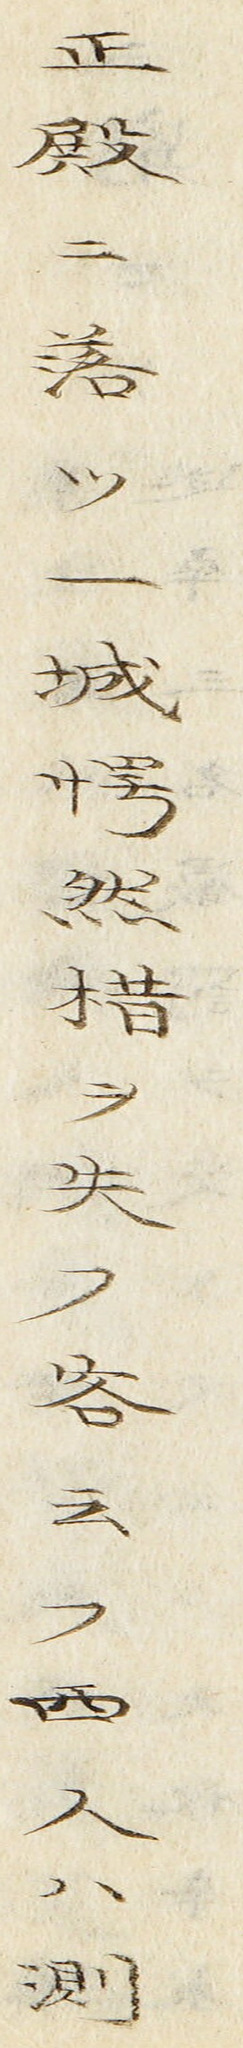正殿ニ落ツ一城愕然棤ヲ失フ客云フ西人ハ測
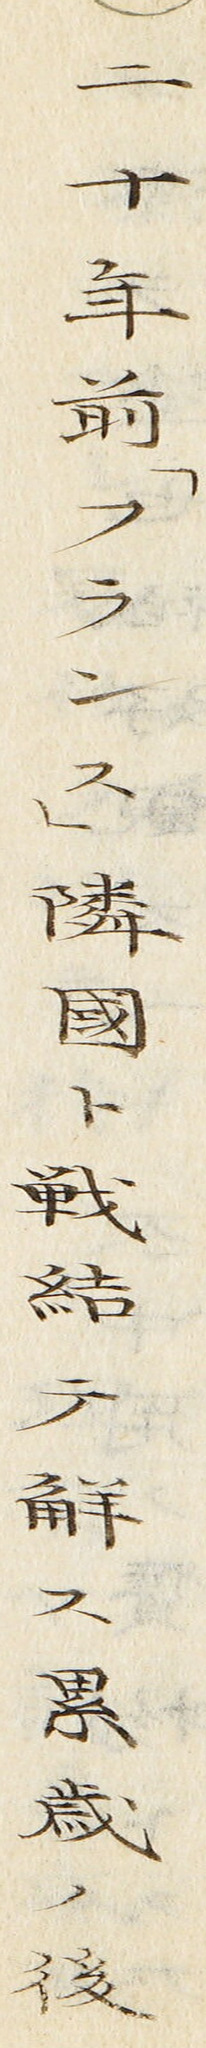〇二十年前「フランス」隣国ト戦結テ觧累歳ノ後
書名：蕃談
